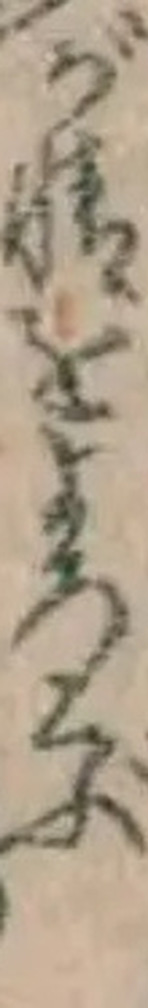が情をよろこぶ
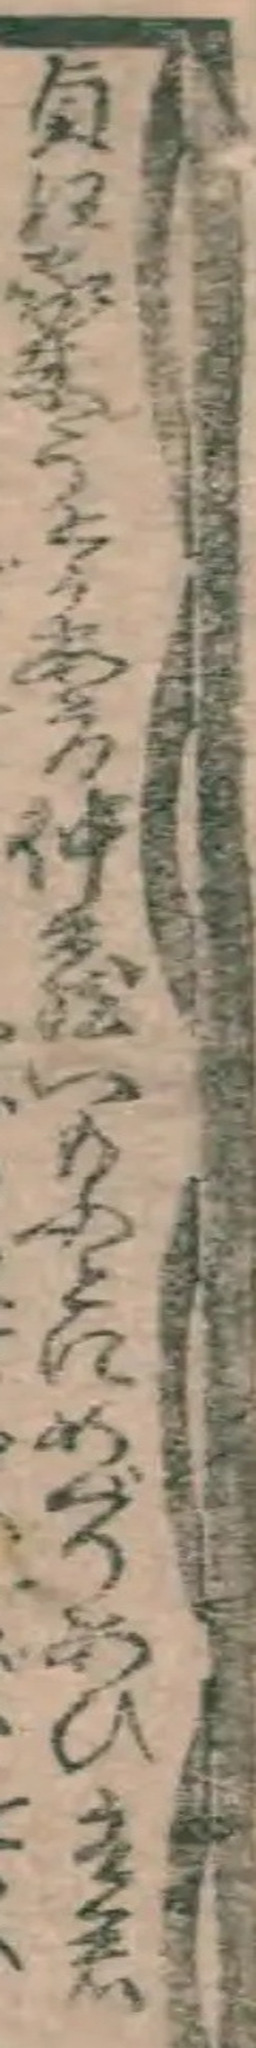貞任家来うとう安方仲蔵いもふとにめぐりあい主君
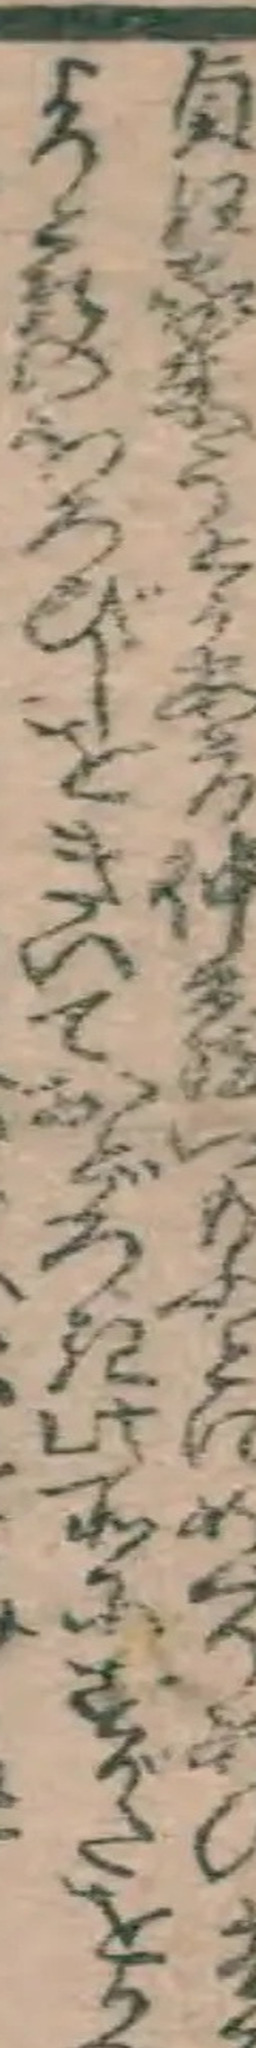よりときのほろびしをきいておどろき此所にすがたをかへ
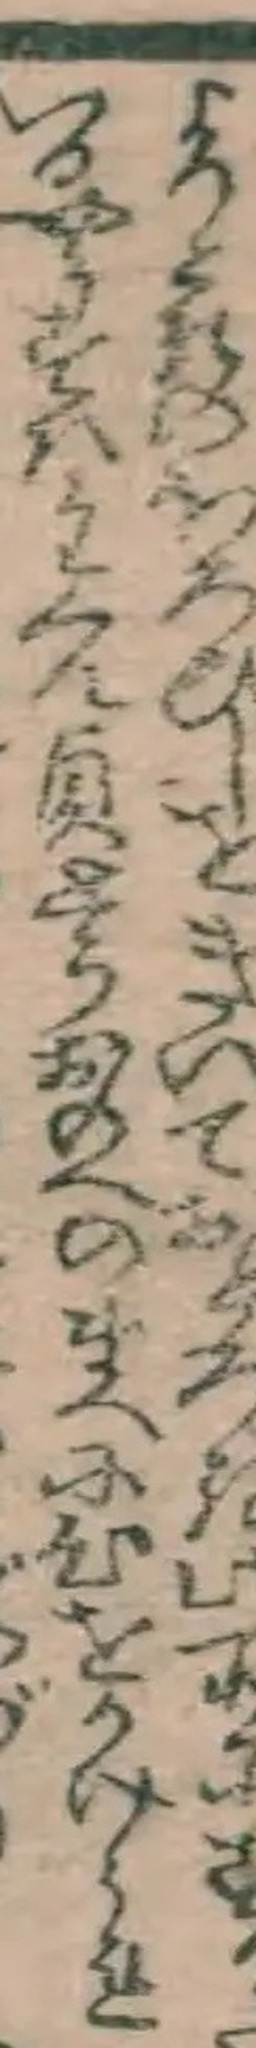いるようすは主くん貞とうおのへのまへに心をかけられ
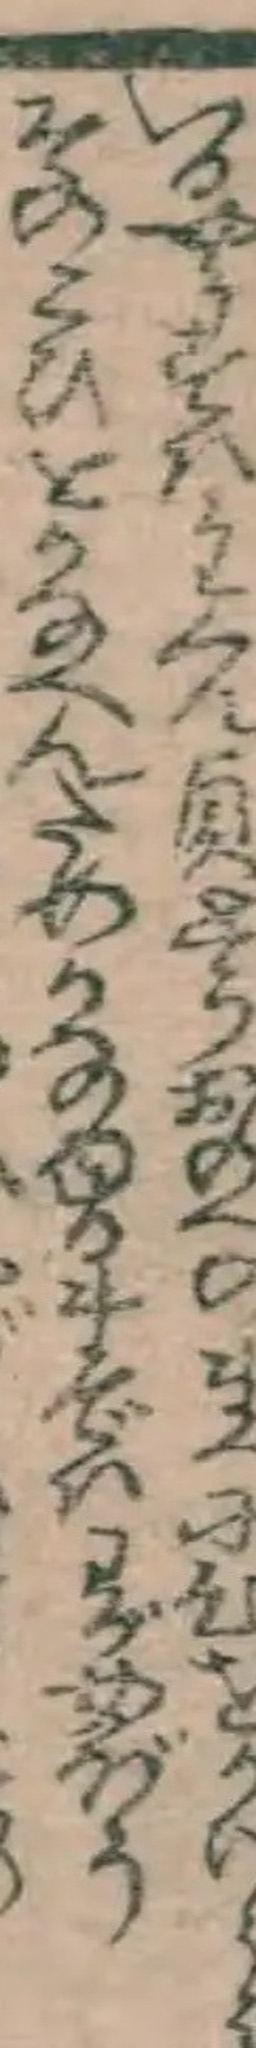そのこひをかなへんためかなゆるまではわが女ぼう
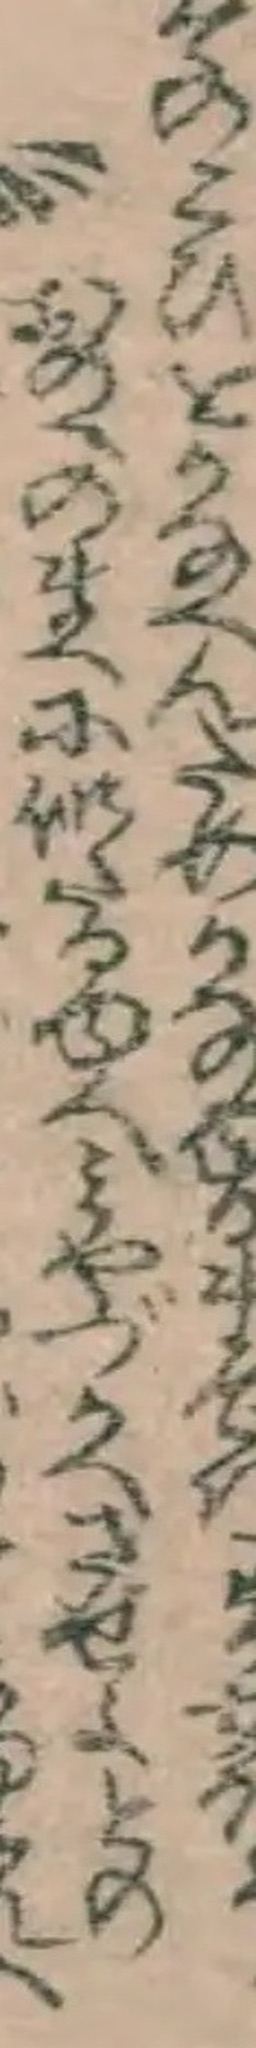おのへのまへに似たるゆへみやづかへさせよとの
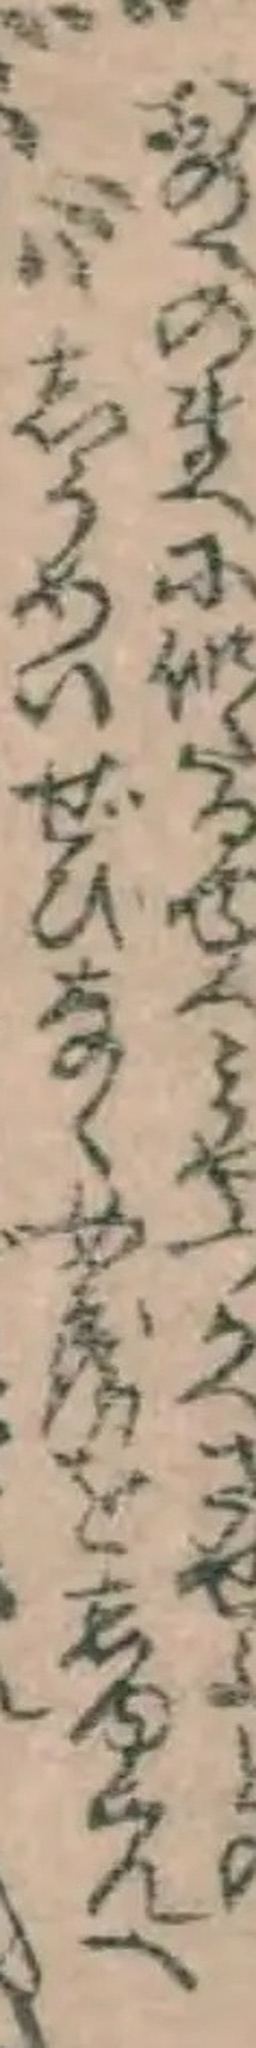しうめいぜひなく女房をしゆくんへ
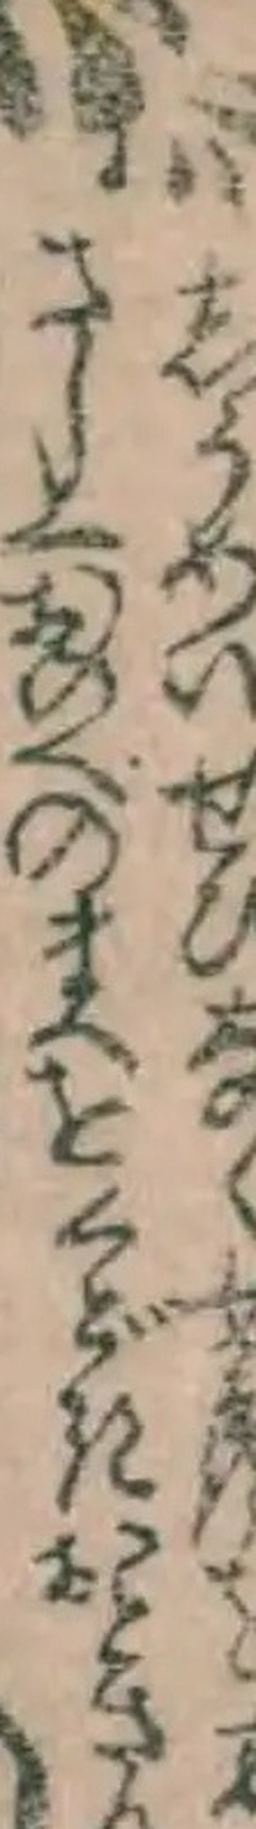さし上おのへのまへをくどきおとさん
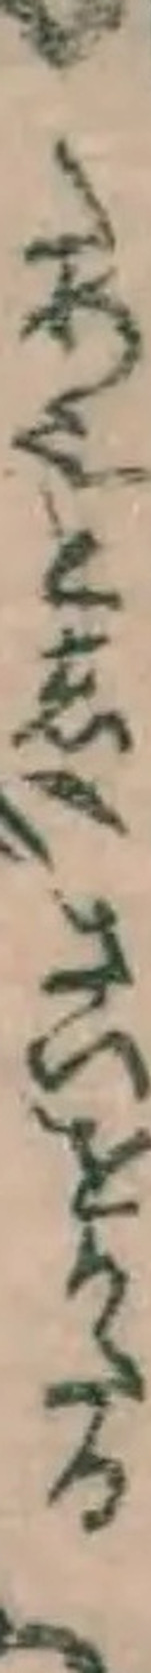ため也としさいをかたる
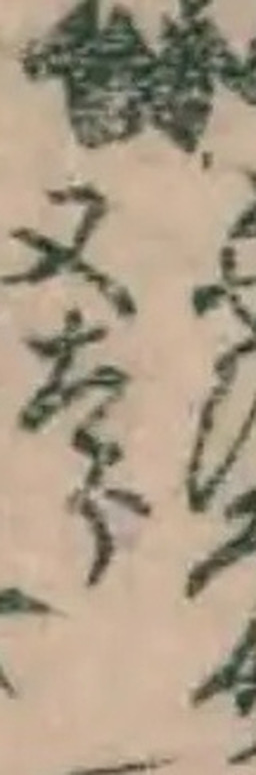又太郎
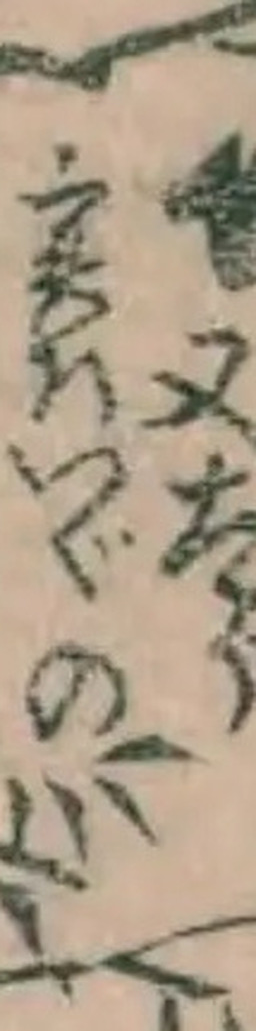実はいぐの
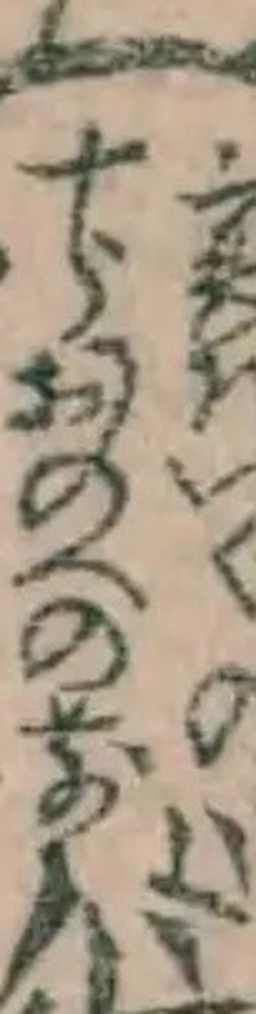十郎おのへの前
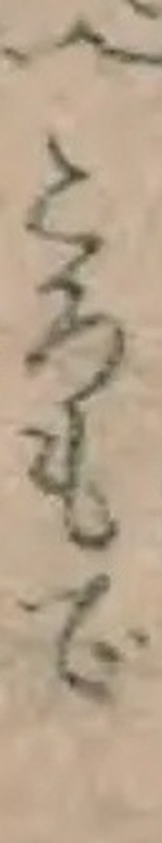ころもで
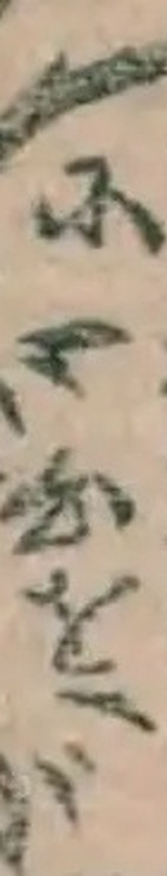に心を
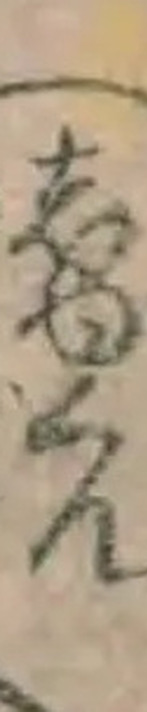しゆくん
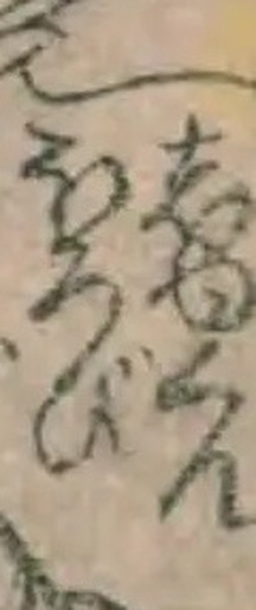ほろび
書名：伊達錦對将 : 森田座
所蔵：国立国会図書館 National Diet Library, JAPAN
